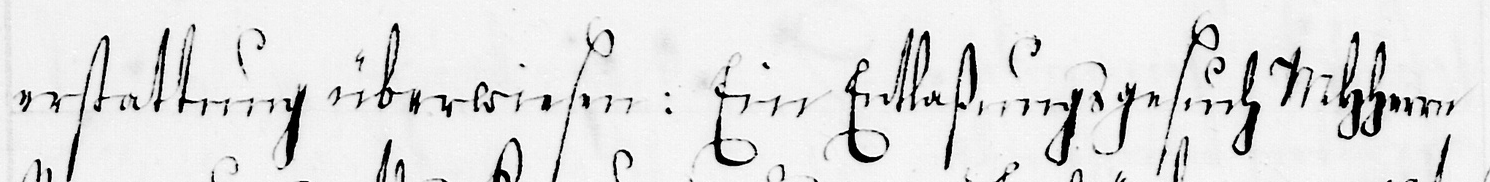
erstattung überwiesen: ein Entlaßungsgesuch MHHerrn
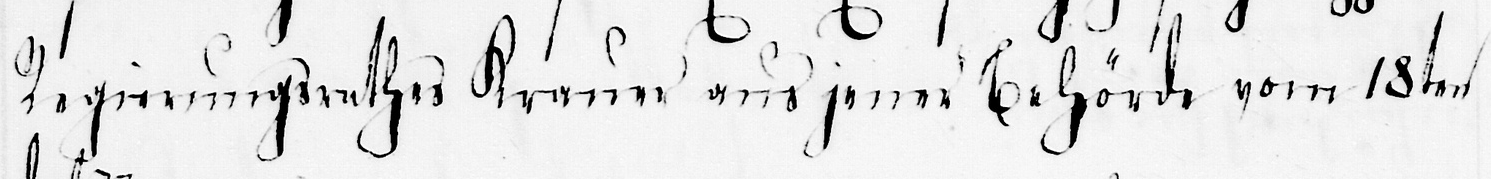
Regierungsrathes Krauer aus jener Behörde vom 18ten
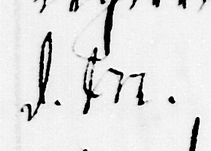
d. M.
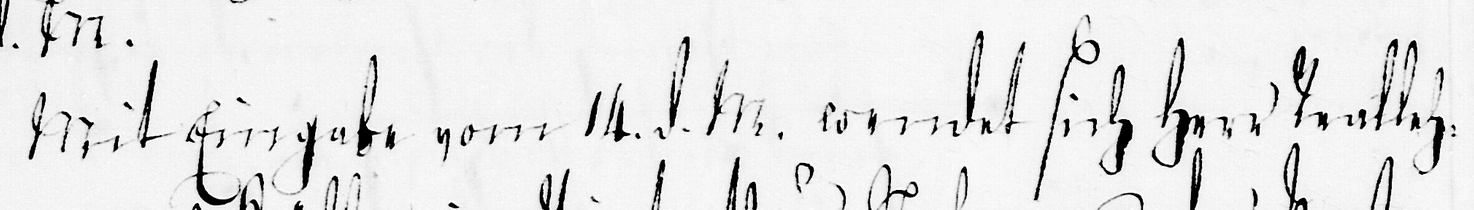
Mit Eingabe vom 14. d. M. wendet sich Herr Realleh¬
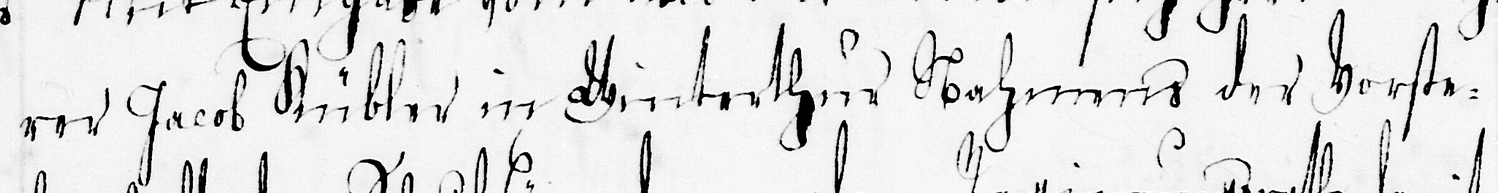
rer Jacob Kübler in Winterthur Nahmens der Vorste¬
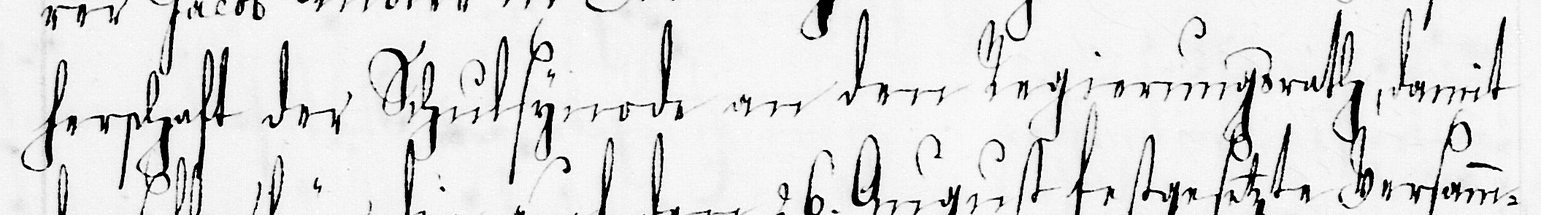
herschaft der Schulsynode an den Regierungsrath, damit
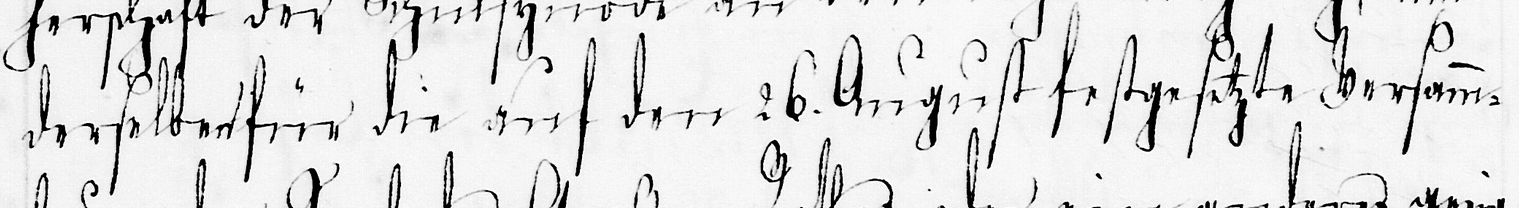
derselben für die auf den 26. August festgesetzte Versamm¬
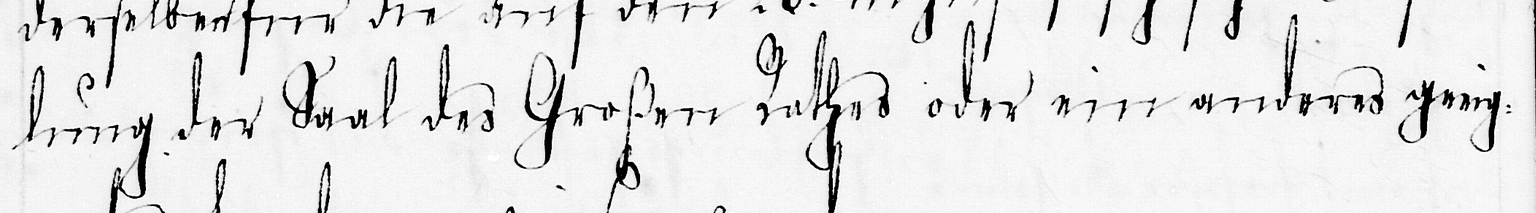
lung der Saal des Großen Rathes oder ein anderes geei¬
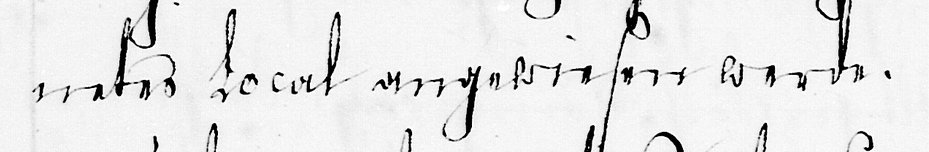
gnetes Local angewiesen werde.
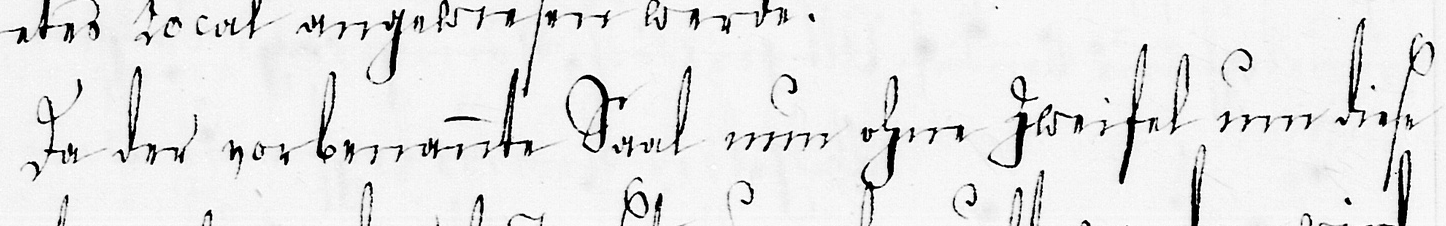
Da der vorbenannte Saal nun ohne Zweifel um diese
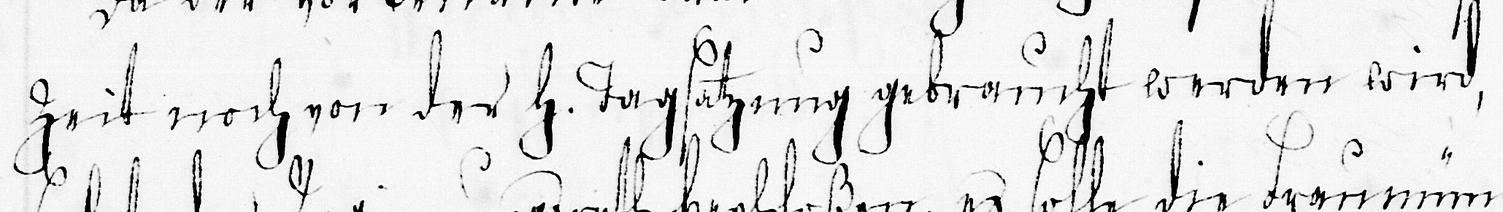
Zeit noch von der H. Tagsatzung gebraucht werden wird,
